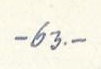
63
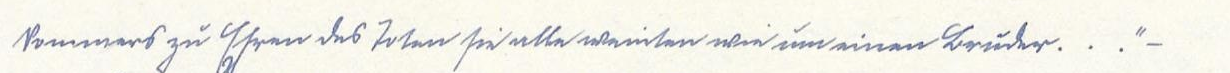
kommers zu Ehren des Toten sie alle weinten wie um einen Bruder…“
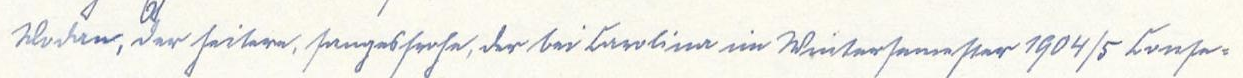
Wodan, der heitere, sangesfrohe, der bei Carolina im Wintersemester 1404/5 Conse-
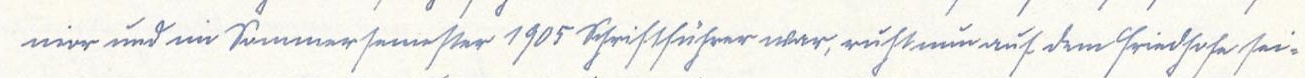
nior und ein Sommersemester 1905 Schriftführer war, ruht nun auf dem Friedhofe sei-
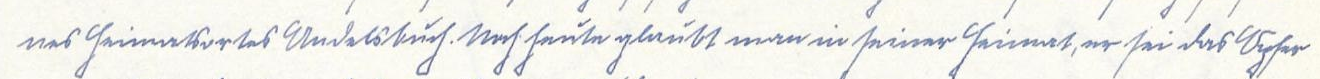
nes Heimatortes Andelsbuch. Noch heute glaubt man in seiner Heimat, er sei das Opfer
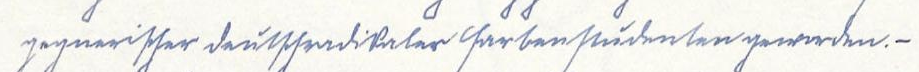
gegnerischer deutschradikaler Farbenstudenten geworden.-
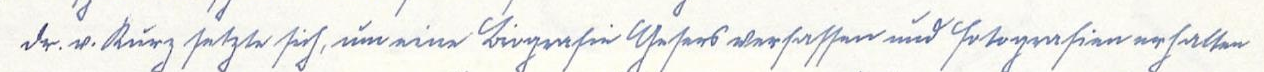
Dr. v. Kurz setzte sich, um eine Biografie Gesers zu verfassen und Fotografien erhalten
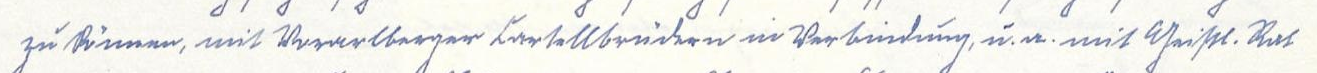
zu können, mit Vorarlberger Cartellbrüdern in Verbindung, u. a. mit Geistl. Rat
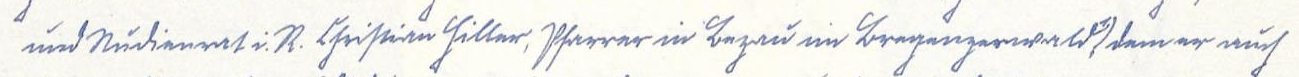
und Studienrat i. R. Christian Hiller (x), Pfarrer in Bezau im Bregenzerwald 3), dem er auch
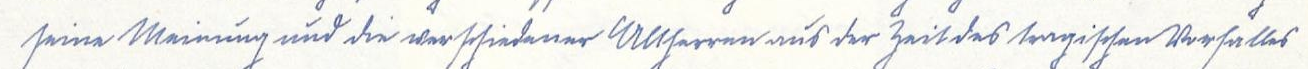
seine Meinung und die verschiedener Altherren aus der Zeit des tragischen Vorfalles
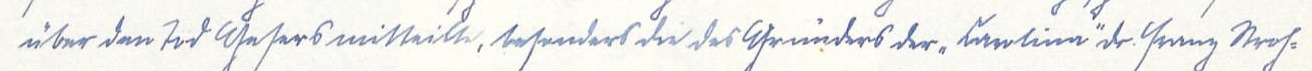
über den Tod Gesers mitteilte, besonders die des Gründers der „Carolina“ Dr. Franz Stroh-
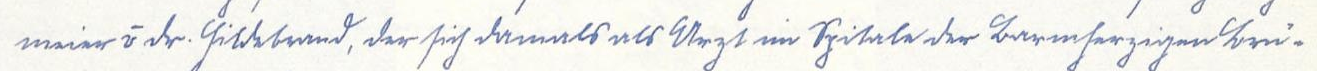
v/o Dr. Hildebrand, der sich damals als Arzt im Spital in der barmherzigen Brü-
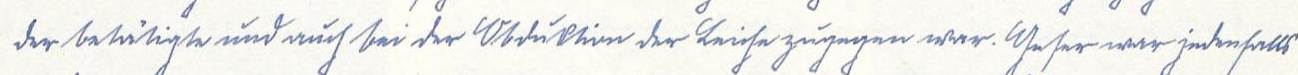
der betätigte und auch bei der Obduktion der Leiche zugegen war. Geser war jedenfalls
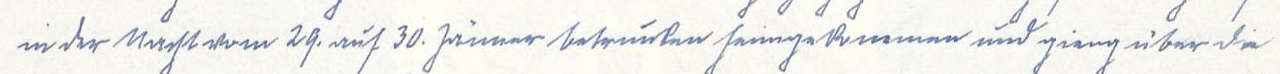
in der Nacht vom 29. auf 30. Jänner betrunken heimgekommen und ging über die
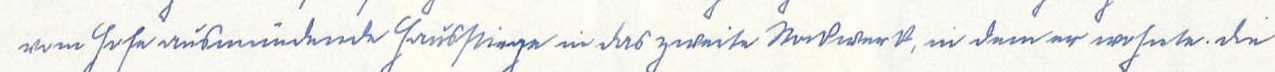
vom Hofe ausmündende Hausstiege in das zweite Stockwerk, in dem er wohnte. Die
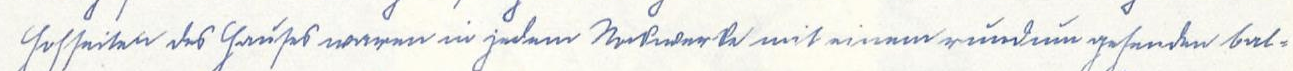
Hofseiten des Hauses waren in jedem Stockwerk mit einem rundum gehenden bal-
